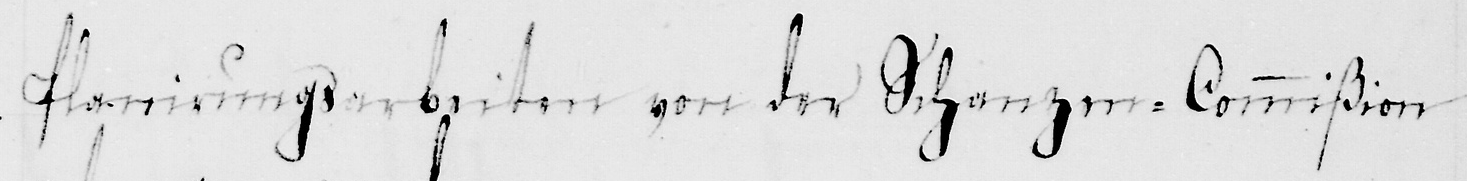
Planierungsarbeiten von der Schanzen-Commißion
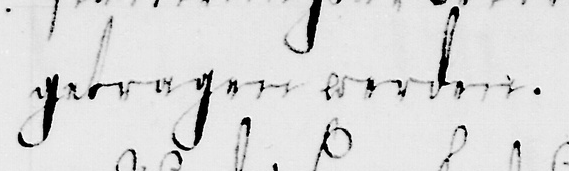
getragen werden.
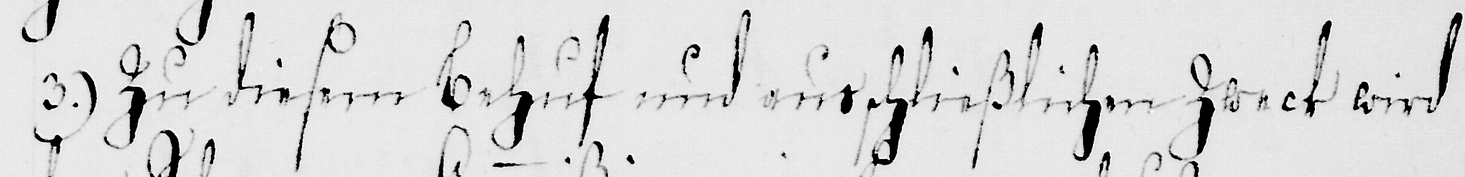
3.) Zu diesem Behuf und ausschließlichen Zweck wird
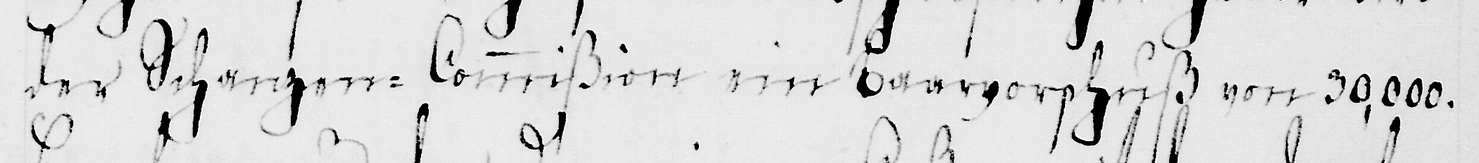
der Schanzen-Commißion ein Baarvorschuß von 30,000.
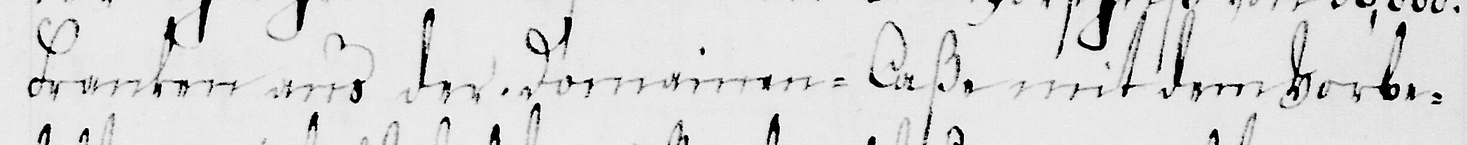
Franken aus der Domainen-Caße mit dem Vorbe¬
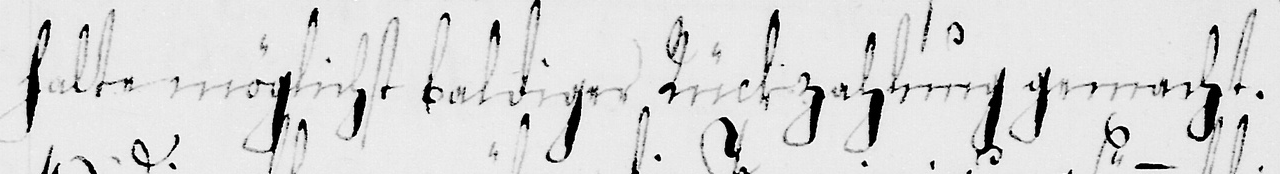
halte möglichst baldiger Rückzahlung gemacht.
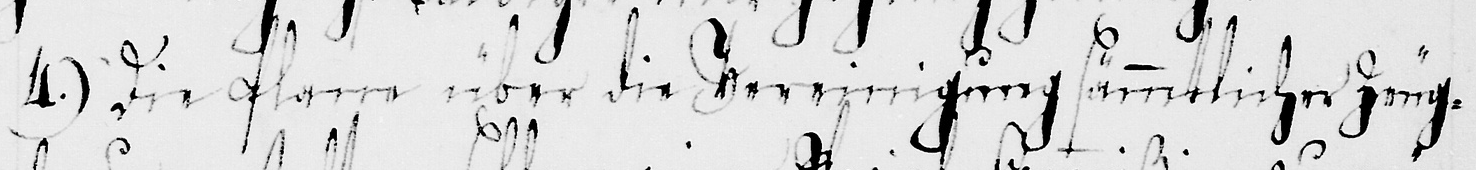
4.) Die Plane über die Vereinigung sämmtlicher Zeug¬
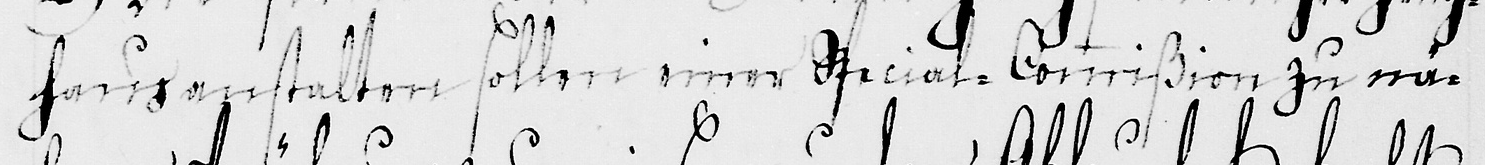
hausanstalten sollen einer Special-Commißion zu nä¬
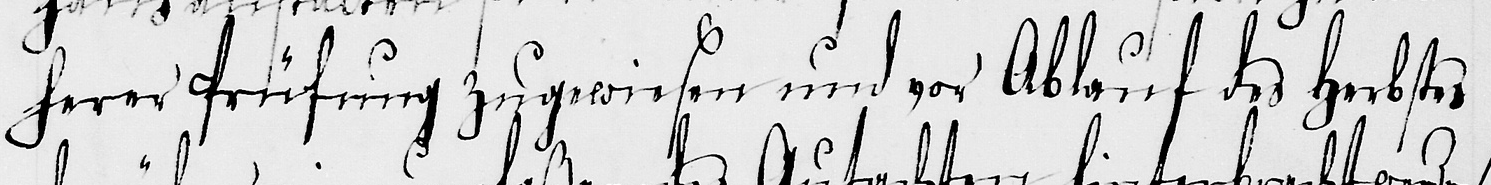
herer Prüfung zugewiesen und vor Ablauf des Herbstes
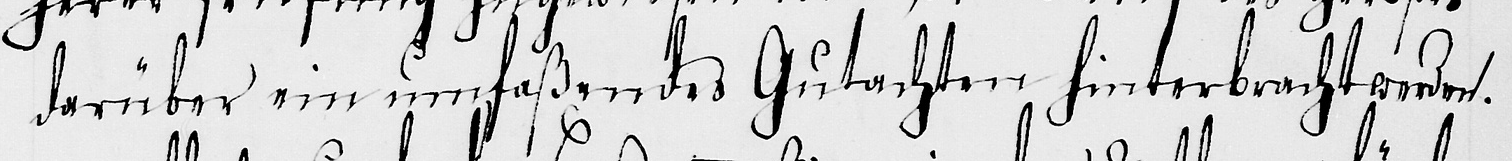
darüber ein umfaßendes Gutachten hinterbracht werden.
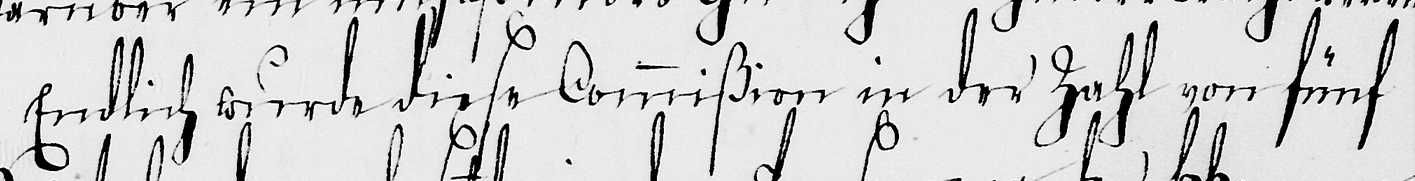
Endlich wurde diese Commißion in der Zahl von fünf
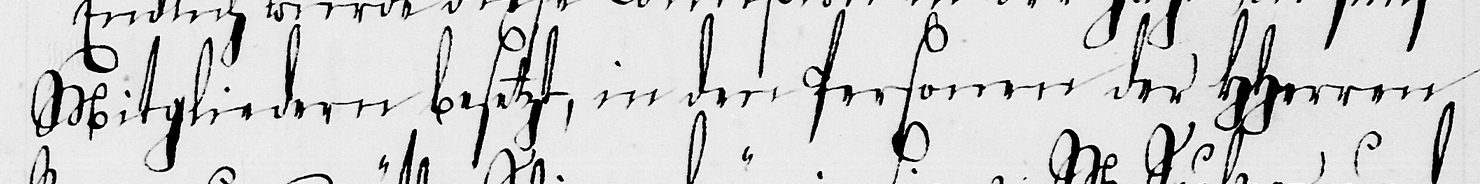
Mitgliedern besetzt, in den Personen der HHerren
